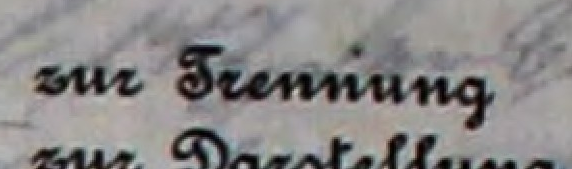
zur Trennung
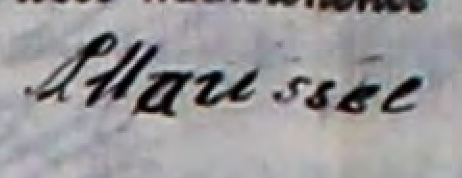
Altaussee
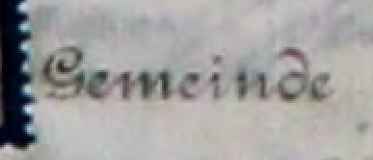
Gemeinde
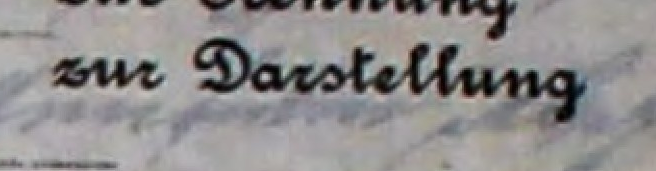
zur Darstellung
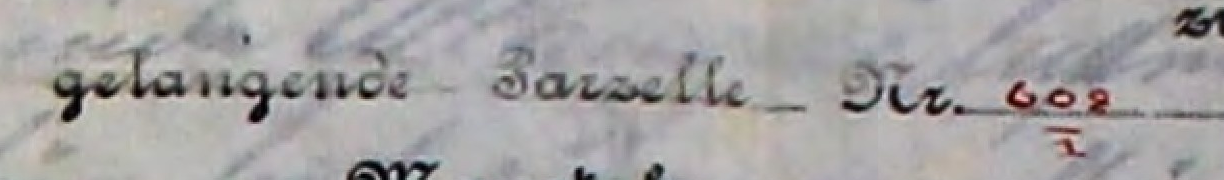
gelangende Parzelle Nr. 002/1
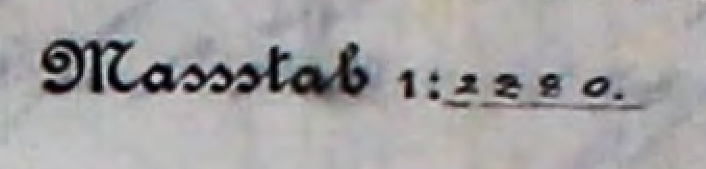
Massstab 1: 2280.
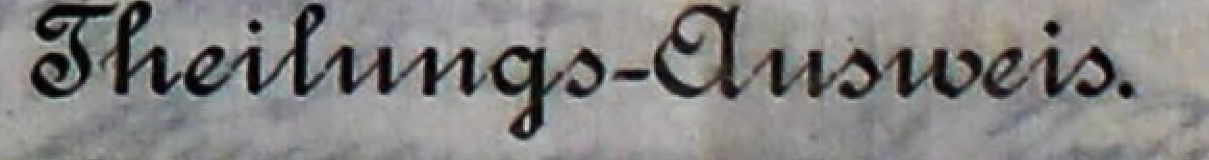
Theilungs-Ausweis.
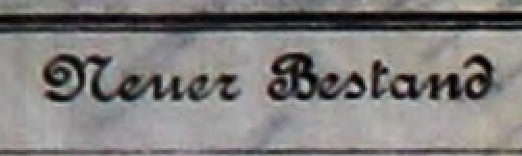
Neuer Bestand
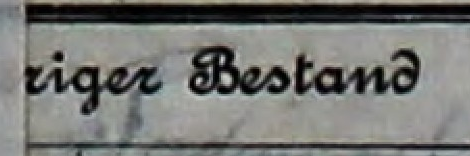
?iger Bestand
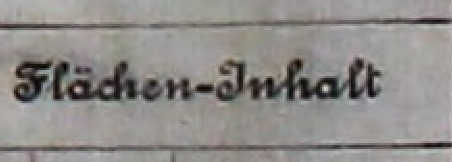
Flächen-Inhalt
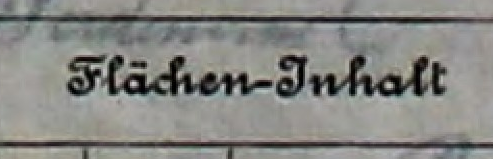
Flächen-Inhalt
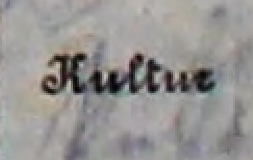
Kultur
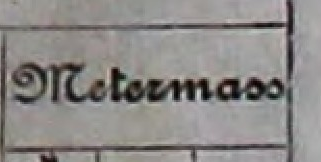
Metermass
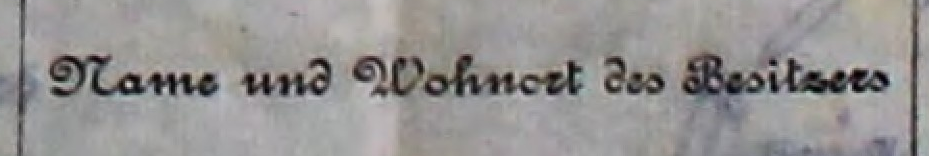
Name und Wohnort des Besitzers
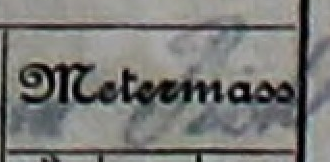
Metermass
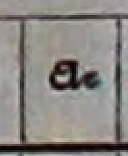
Ac
